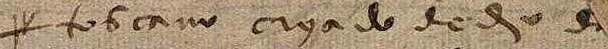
item toscano cryado de djo d
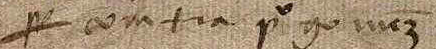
item comtra po gomez
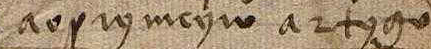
ao prymeyro artygo
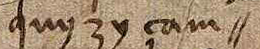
quysyçam //
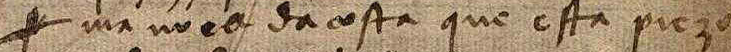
item manoel da costa que esta prezo
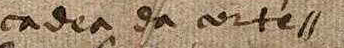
cadea da corte //
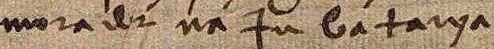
morador na Jubatarya
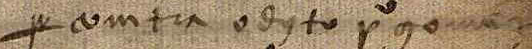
item comtra o dyto po gomez
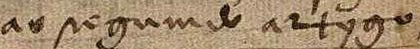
ao segumdo artygo
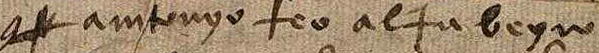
ꝯ item amtonyo feo alJubeyro
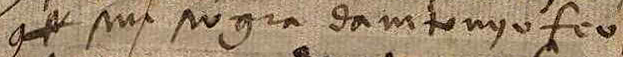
ꝯ item sua sogra damtonyo feo
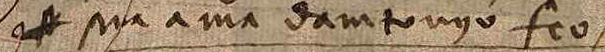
ꝯ item sua ama damtonyo feo /
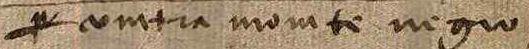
item comtra momtenegro
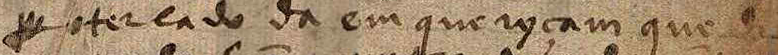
item o terlado da emqueryçam que da
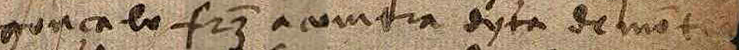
gonçalo frz̄ a comtradyta de mōte
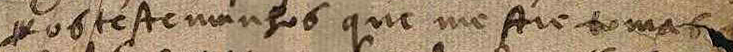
ite os testemunhos que mestre tomas
